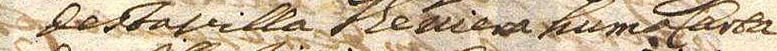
desta villa lhe uiera huma Carta
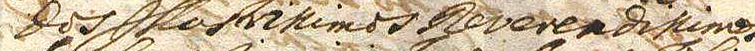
dos Illustrissimos Reverendissimos
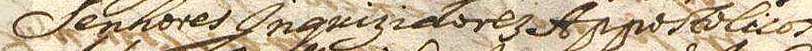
Senhores Jnquizidorez Appostolicos
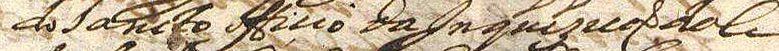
do Sancto offiçio da Jnquizicaõ da Ci
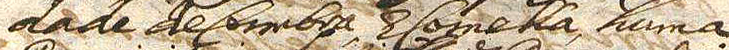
dade de Coimbra, E Com ella, huma
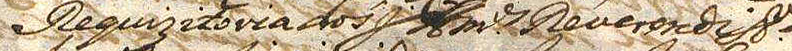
Requizitoria dos Jllm.os Reuerendissos.
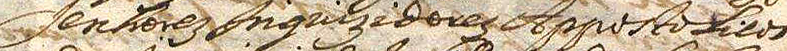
Senhores Inquizidorez Appostolicos
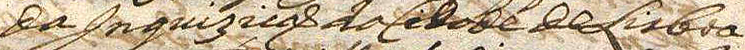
da Jnquiziçaõ da Cidade de Lisboa
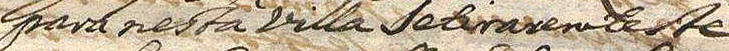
para nesta villa se tirarem teste
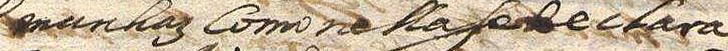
munhaz Como nella se declara
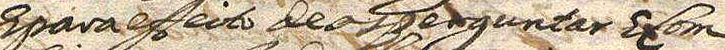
E para effeito de as perguntar E Com
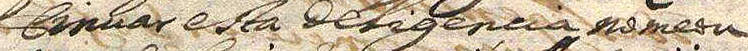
tinuar esta deLigençia nomeou
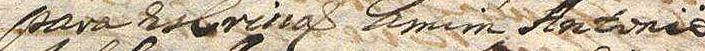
para EsCriuaõ a mim Antonio
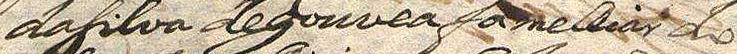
da silua de gouvea famelliar do
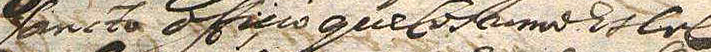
Sancto offiçio que Costumo EsCre
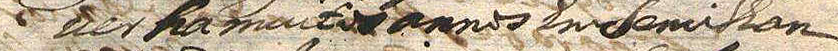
uer ha muitos annos Em semilhan
